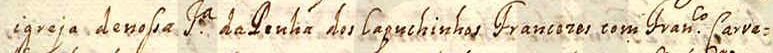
igreja de nossa S.a da Penha dos Capuchinhos Francezes com Fran.co Carva
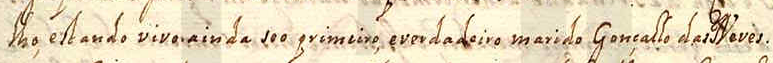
lho, estando vivo ainda seo primeiro, e verdadeiro marido Gonçallo das Neves.
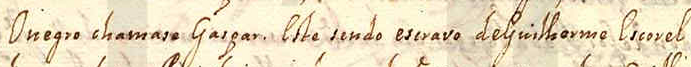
O negro chamase Gaspar. Este sendo escravo de Guilherme Escorel
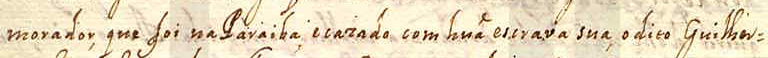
morador, que foi na Paraiba e cazado com huā escrava sua o dito Guilher
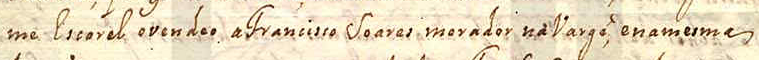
me Escorel o vendeo a Francisco Soares morador na Vargē, e na mesma
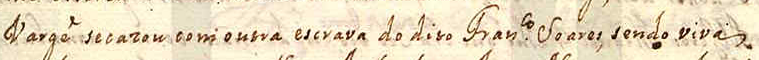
Vargē se cazou com outra escrava do dito Fran.co Soares, sendo viva
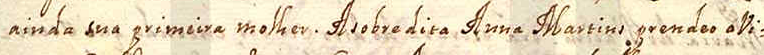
ainda sua primeira molher. A sobredita Anna Martins prendeo o Vi
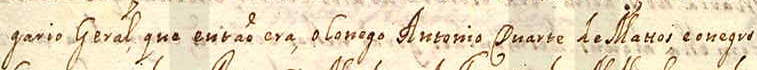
gario Geral, que entaõ era, o Conego Antonio Duarte de Mattos, e o negro
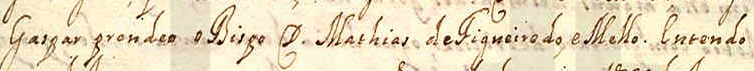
Gaspar prendeo o Bispo D. Mathias de Figueiredo, e Mello. Entendo
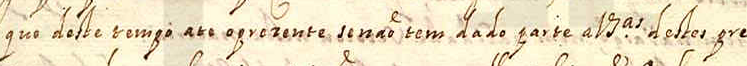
que deste tempo ate o prezente se naõ tem dado parte a V S.as destes pre
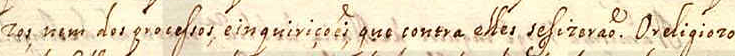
zos, nem dos processos, e inquiriçoẽs, que contra elles se fizeraõ. O religiozo
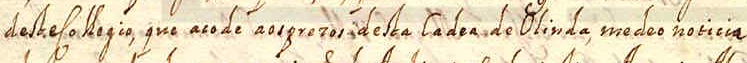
deste Collegio, que acode aos prezos desta Cadea de Olinda, me deo noticia
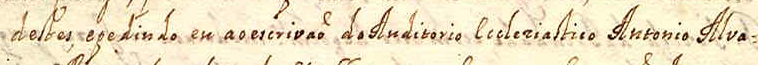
delles, e pedindo eu ao escrivaõ do Auditorio Eccleziastico Antonio Alva
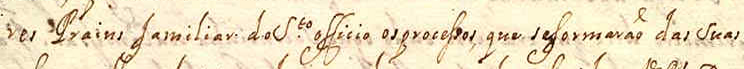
res Prains familiar do S.to officio os processos, que se formaraõ das suas
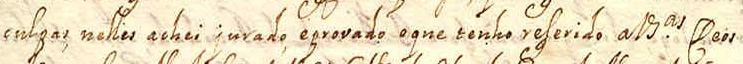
culpas nelles achei jurado, e provado o que tenho referido a V S.as Deos
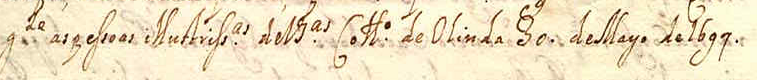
g.de as pessoas illustriss.as de V S.as Coll.o de Olinda 30. de Mayo de 1697.
